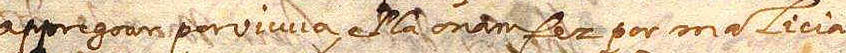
appregoar por viuua, ella o nam fez por maLicia
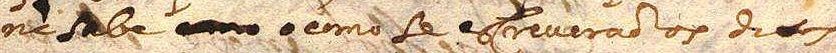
nē sabe como o como se esCreueraõ os ditos
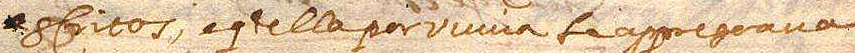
esCritos, e q̄ ella por viuua se appregoaua
